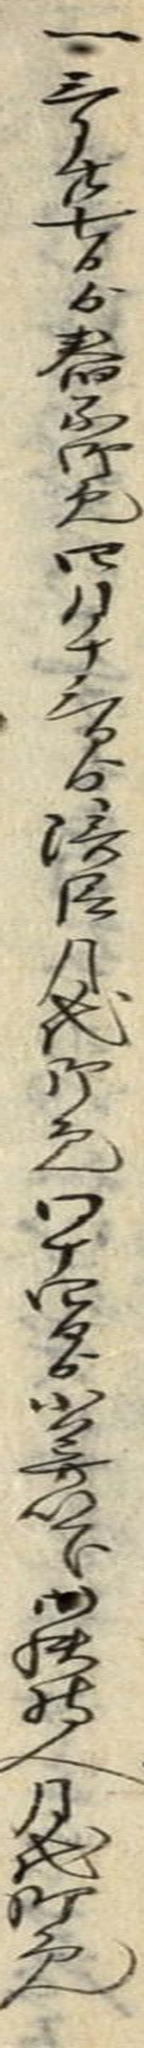一三月廿七日ゟ舂米御免四月十三日ゟ陪臣月代御免同十四日ゟ小算以下御扶持人月代御免
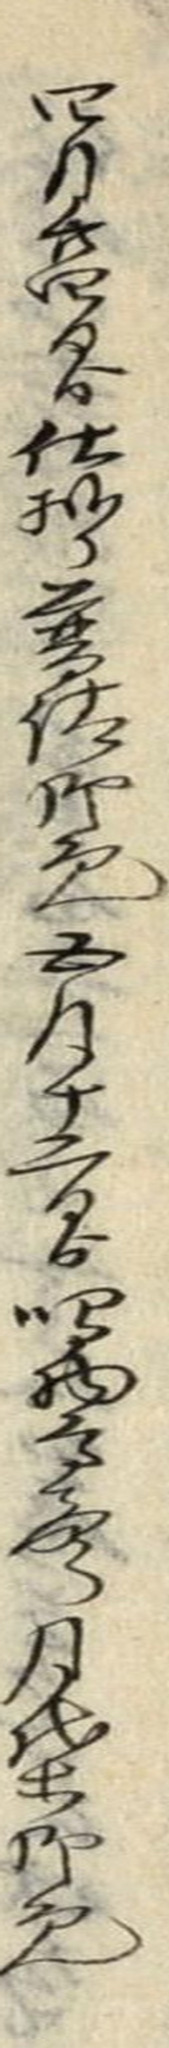四月廿四日ゟ仕掛り普請御免五月十二日ゟ鳴物高声月代等御免
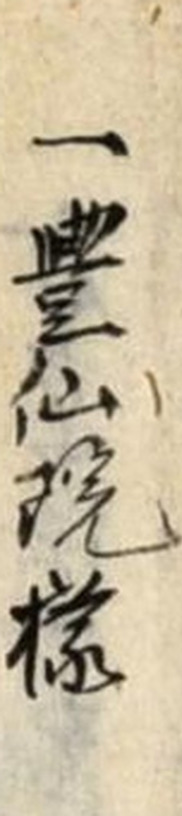一豊仙院様
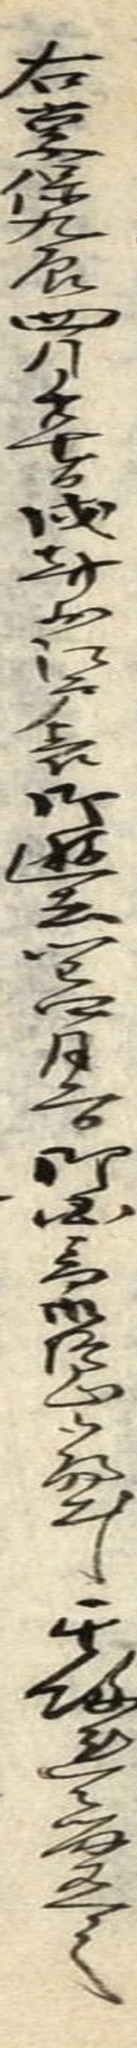右享保九辰四月廿七日戌刻於江戸表御逝去閏四月二日御国にて御停止御触出し其余連々留有之
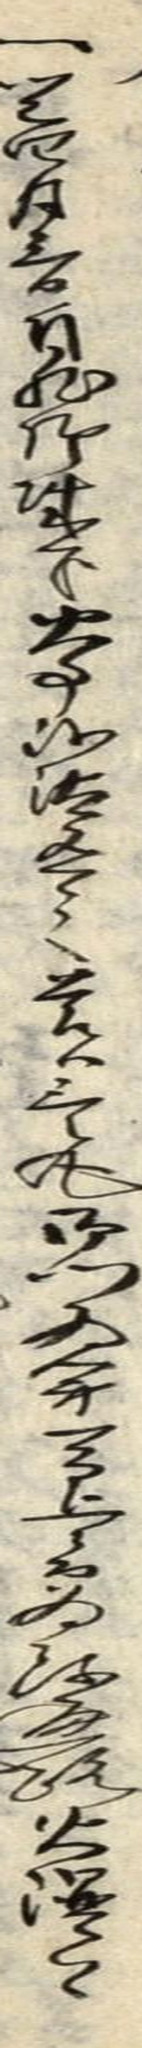一閏四月三日自然御城下火事沙汰有之節は三之丸御門為開馬上にて為致通路火湿候はゝ
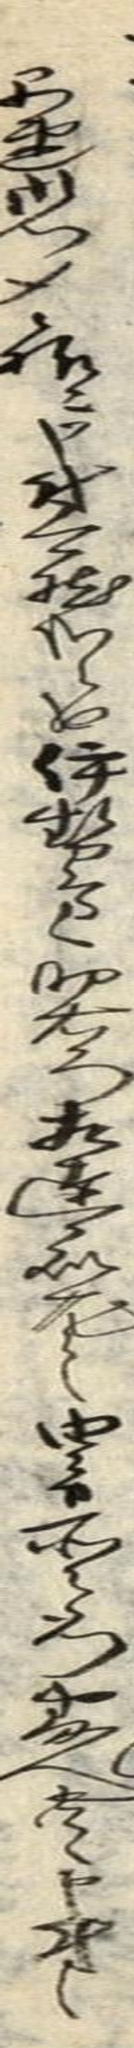早速御門〆候様に申付可然哉之儀伊勢方へ助右衛門相達候処尤之由申に付所々御門番人共へ申付之
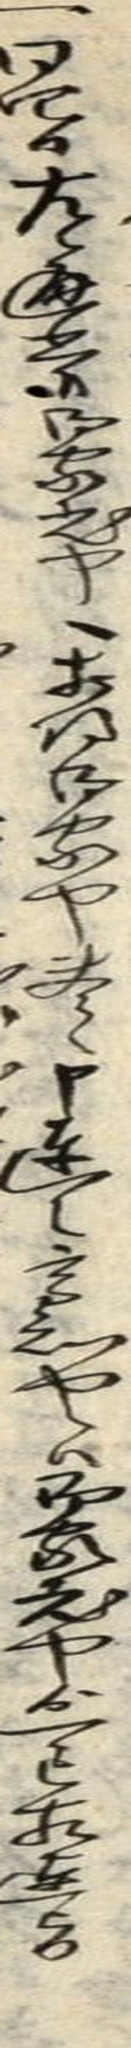一同四日左之通書付御家老中へ相伺御家中夫々申達之高知中へは御家老中ゟ可被相達旨
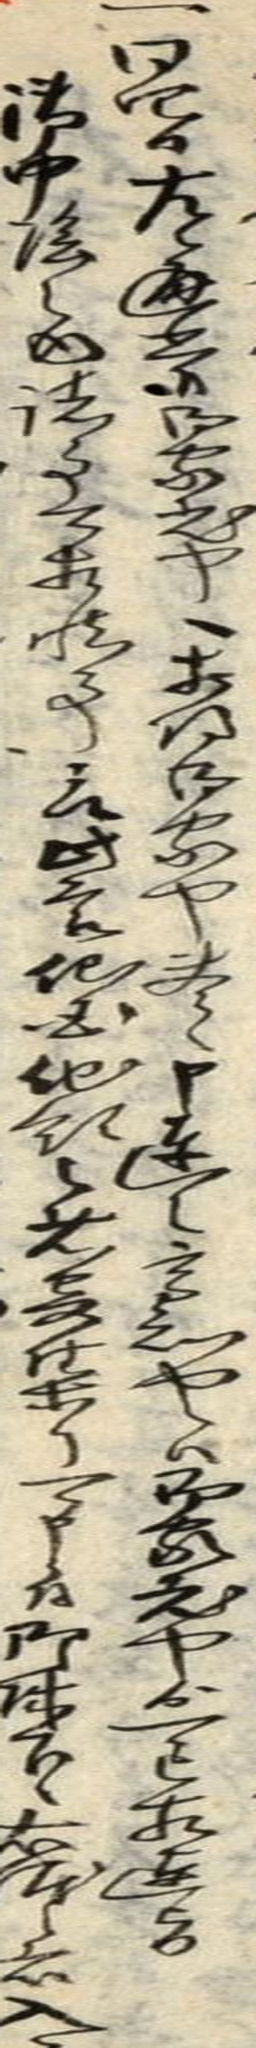御中陰之内諸事可相慎事に候此節他国他領之者寄集り可申付御城下へ右体之者入不申
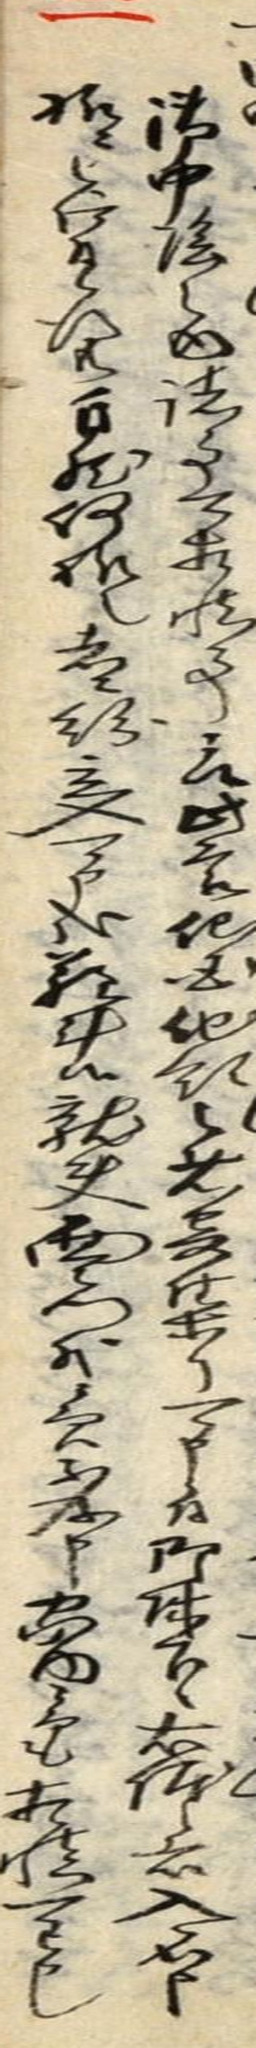様に被仰付候得共自然何様之者に紛立入可申哉難斗候就夫面々門外にては不及申家内にても相慎可被申候

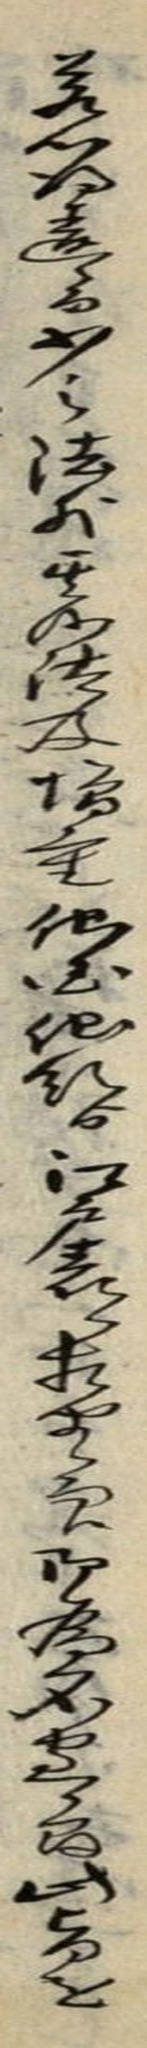若心得違にて少之法外其沙汰及増重他国他領ゟ江戸表へ相聞候ては御為不宜候間此旨を
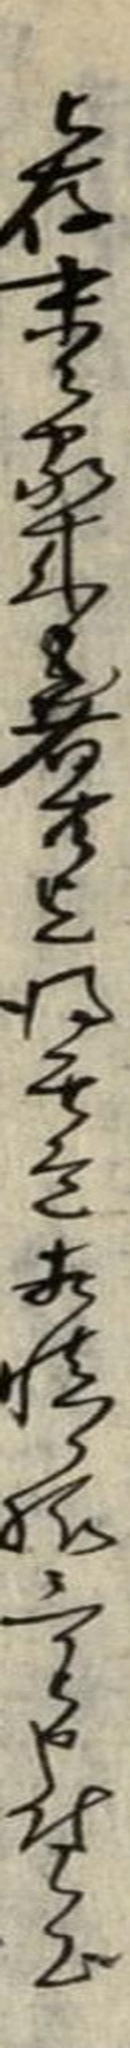被存末々家来之者共迄得其意相慎候様に可被申付候以上
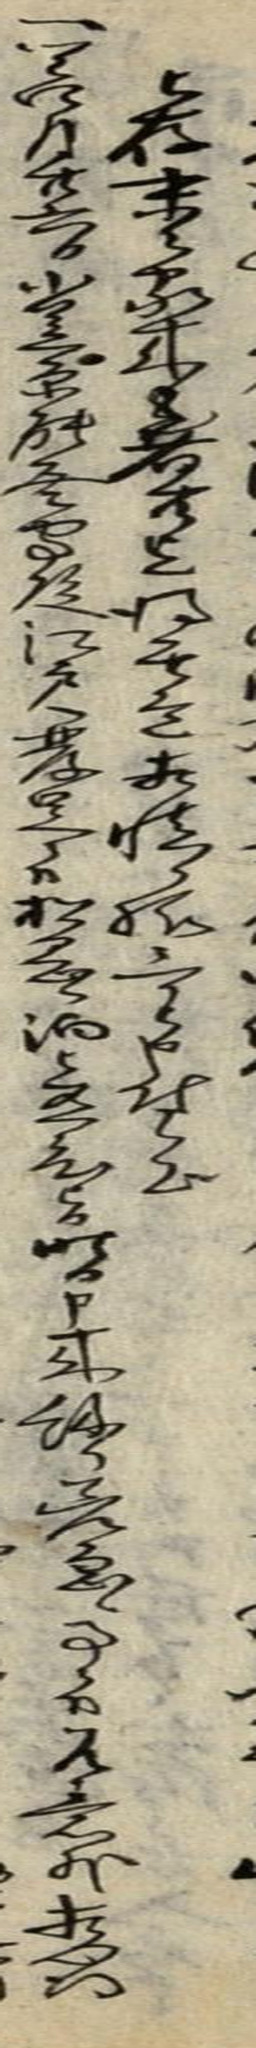一閏四月廿六日小笠原能登守殿江戸へ発足に付松岡へ泊被有度旨昨日申来余り差急候事に付乍意外相心得
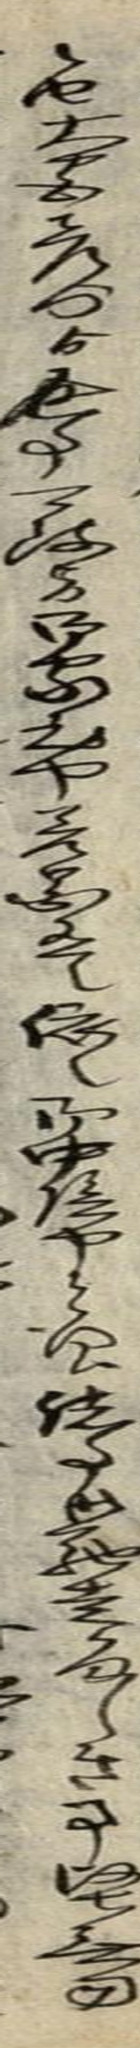候由大宮彦右衛門ゟ返事可致旨御家老中差図有之依之御中陰中に候得は諸事御馳走かましき事堅無用
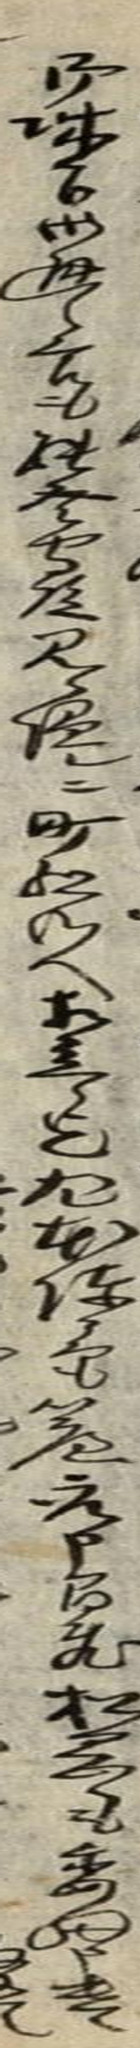御城下御通之節も能登守殿見へ隠レに町組弐人相立候迄尤本陣にても簾取申間敷松岡へも委細申遣候留有之
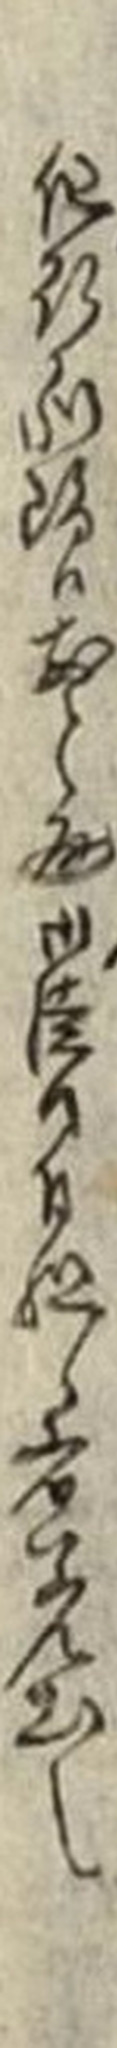但行列附は前々之通御徒目付組之者差出之
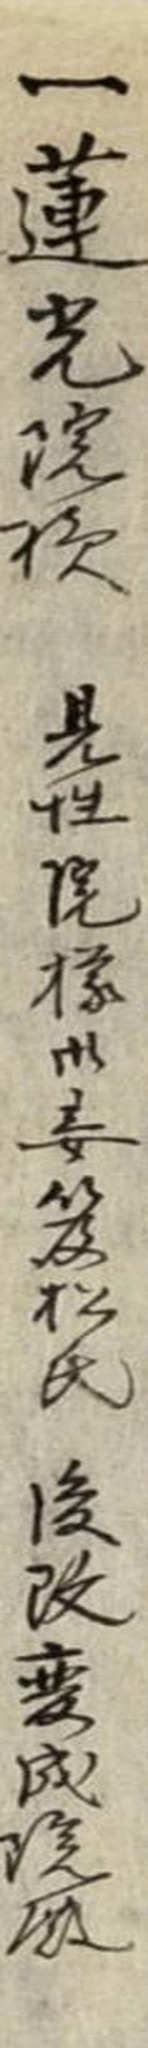一蓮光院様見性院様御妾笈松氏後改変成院殿
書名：御停止異変死失
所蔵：福井県文書館 Fukui Prefectural Archives
